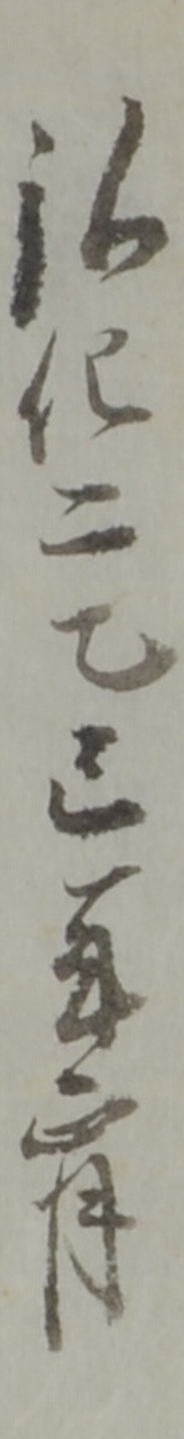弘化二乙巳年下里町
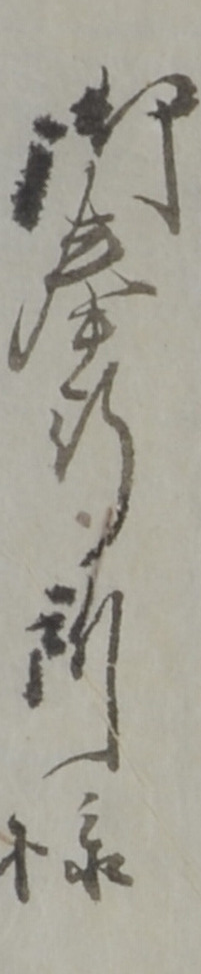御奉行所様
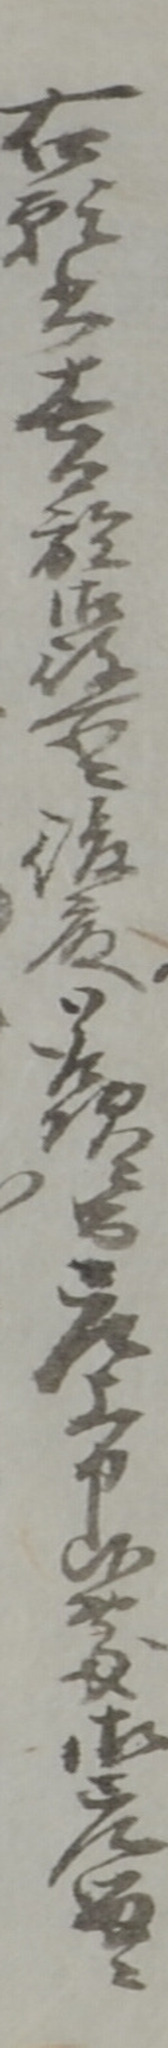右願書十七日於御役所ニ後藤氏御取次ニ而差上申候處御差留ニ
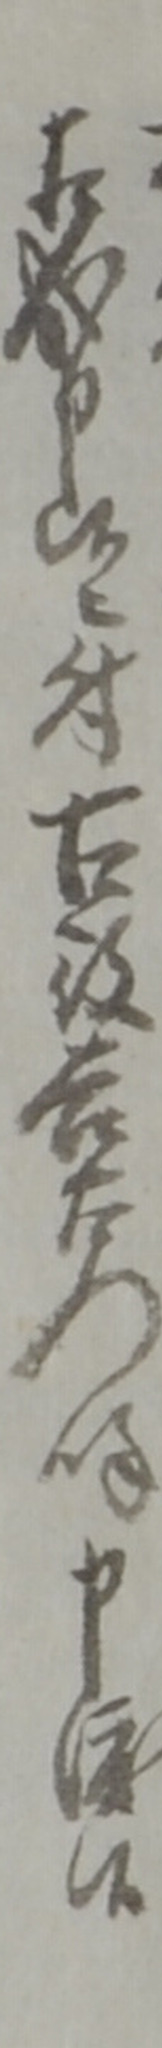相成申候ニ付右役吉右衛門呼申渡候
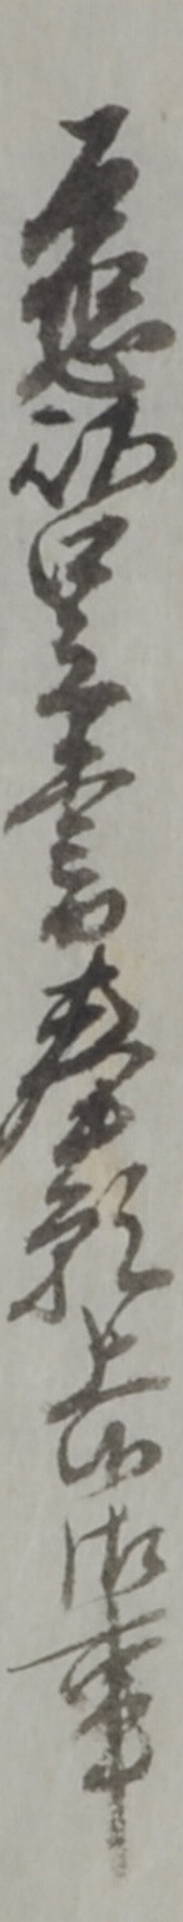乍恐以口上書奉願上候御事
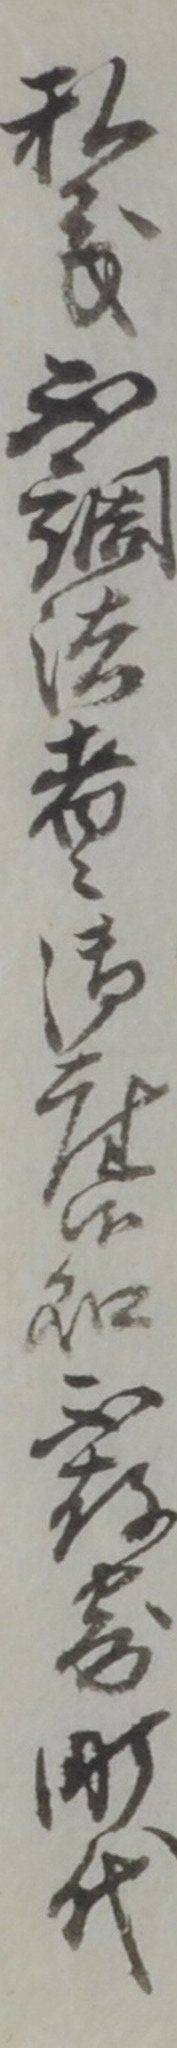私義不調法者ニ御座候処不存寄町代

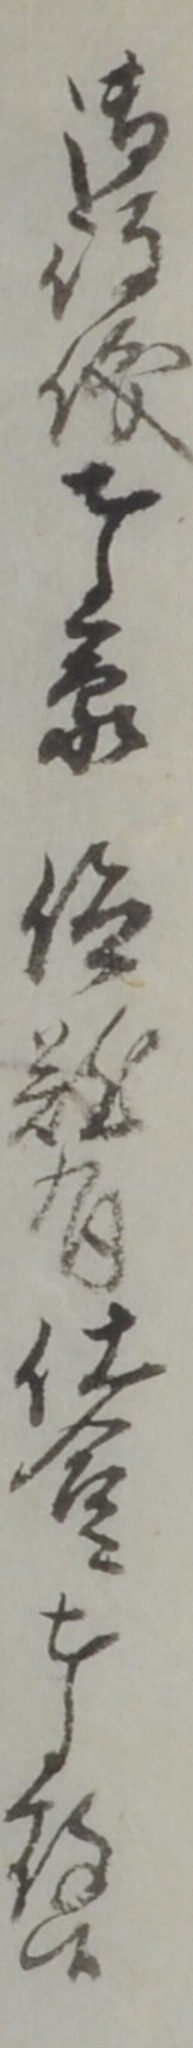御役儀奉蒙仰難有仕合ニ奉存候
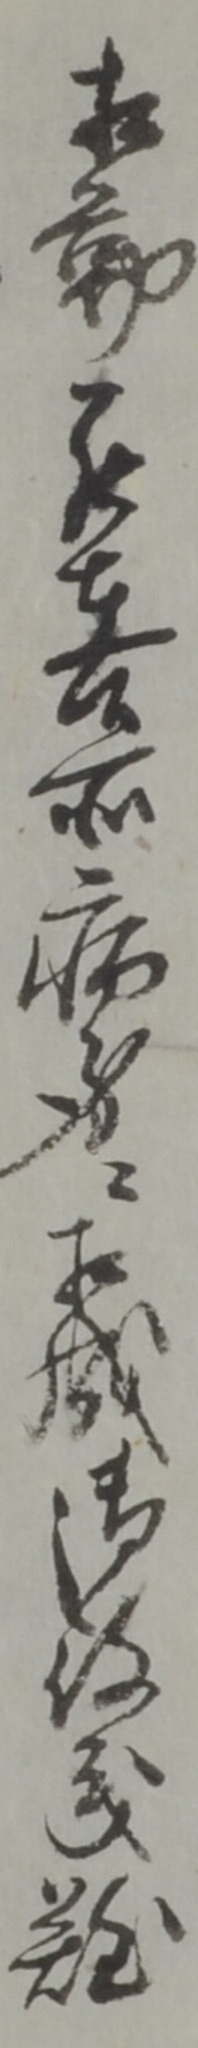相勤罷在候所病身ニ相成御役義難
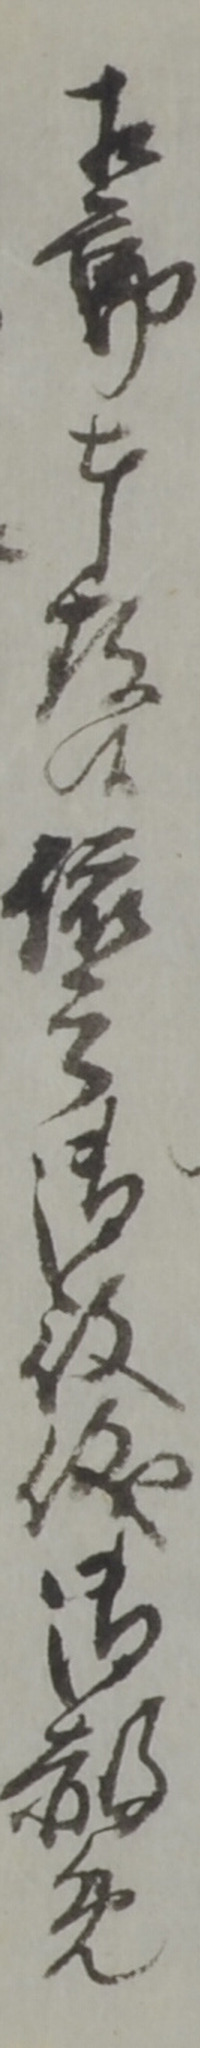相勤奉存候依之御役儀御赦免
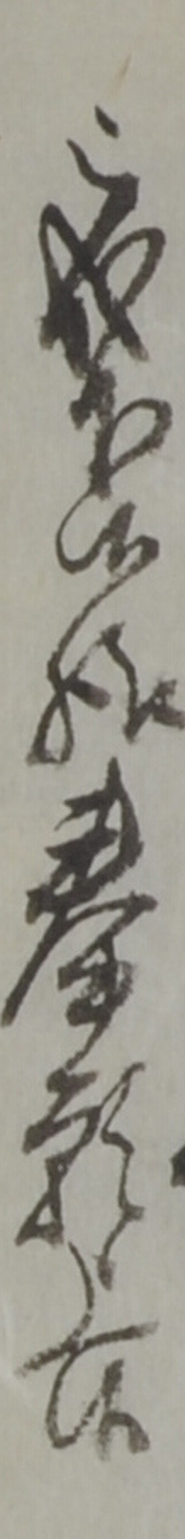被成下候様奉願上候
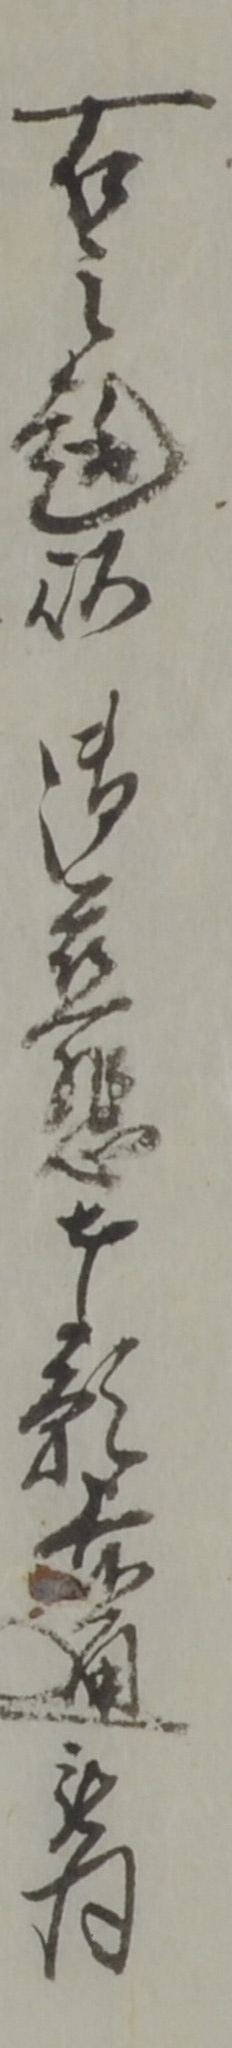右之趣以御慈悲奉願上候通被為
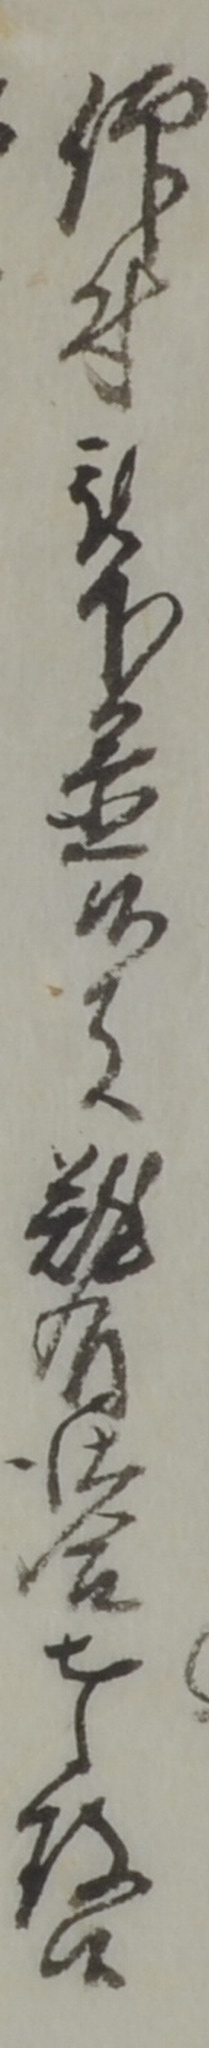仰付被下置候ハヽ難有仕合奉存候
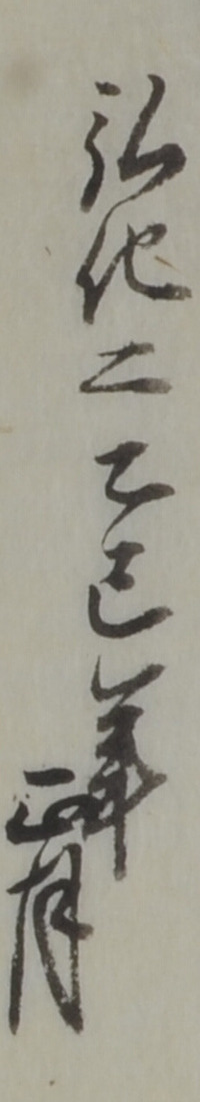弘化二乙巳年正月
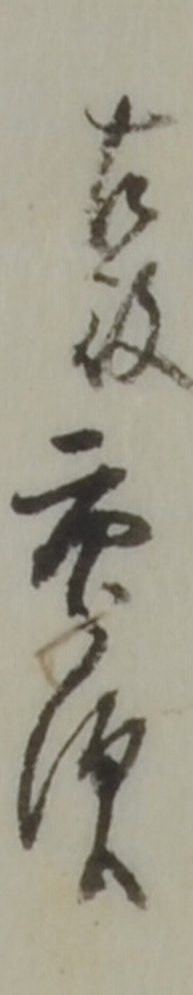古役市次
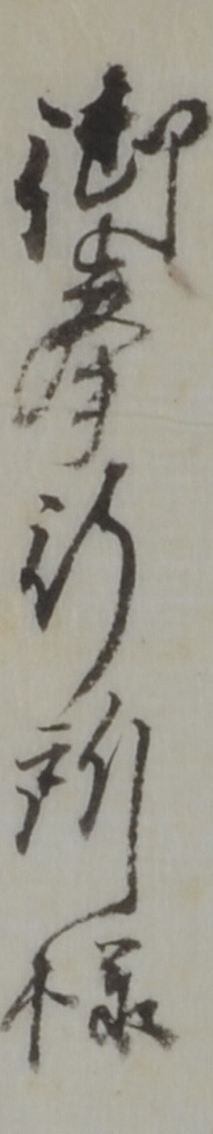御奉行所様
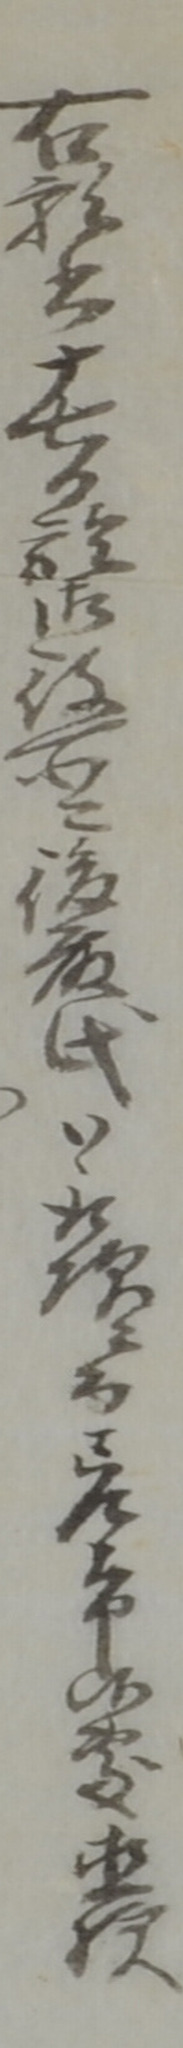右願書十七日於御役所ニ後藤氏御取次ニ而差上申候處直様
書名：諸願書控簿
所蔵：伊那市立高遠町図書館・合同会社AMANE
